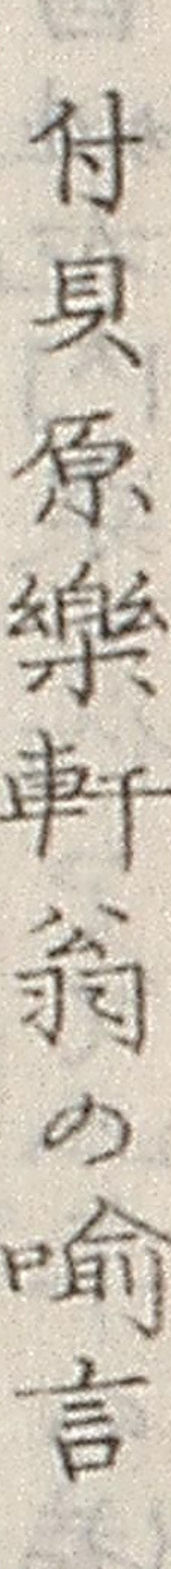付貝原楽軒翁の喩言
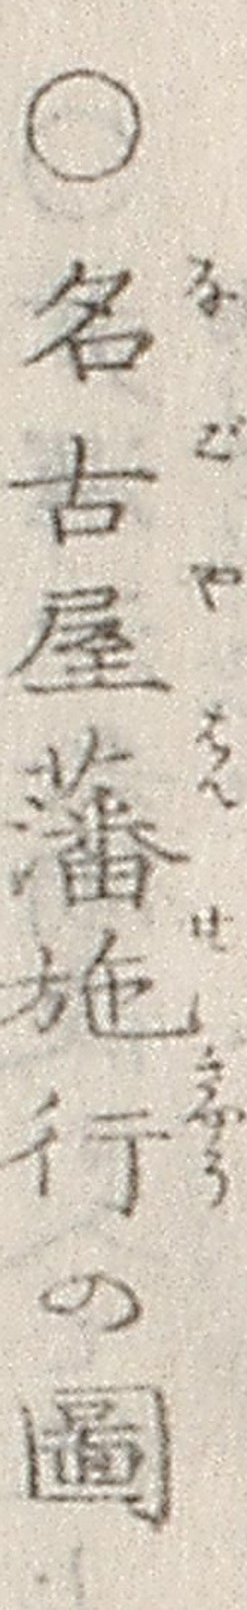〇名古屋藩施行の図
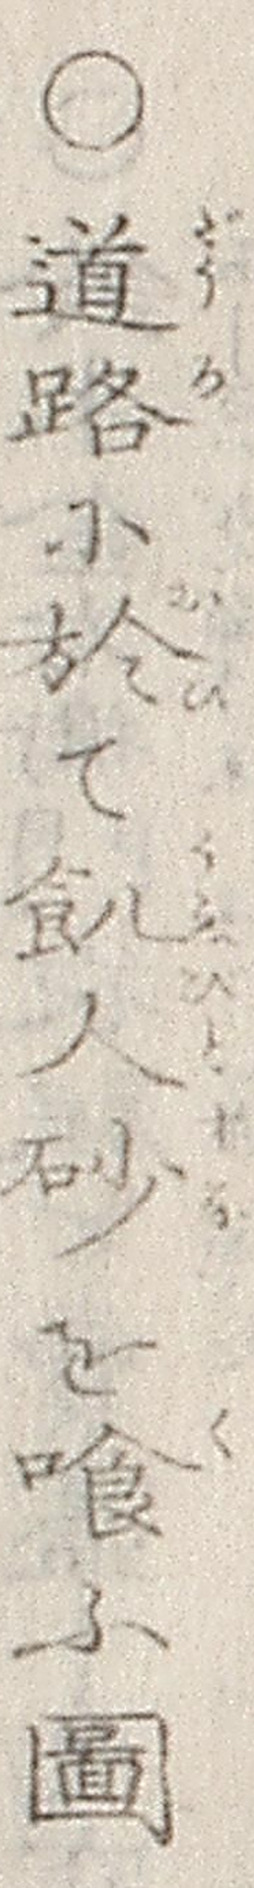〇道路に於て飢人砂を喰ふ図
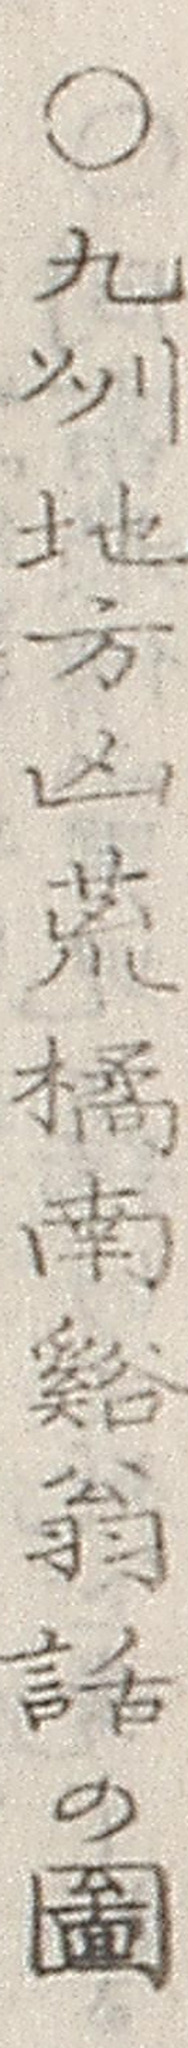〇九州地方凶荒橘南谿翁話の図
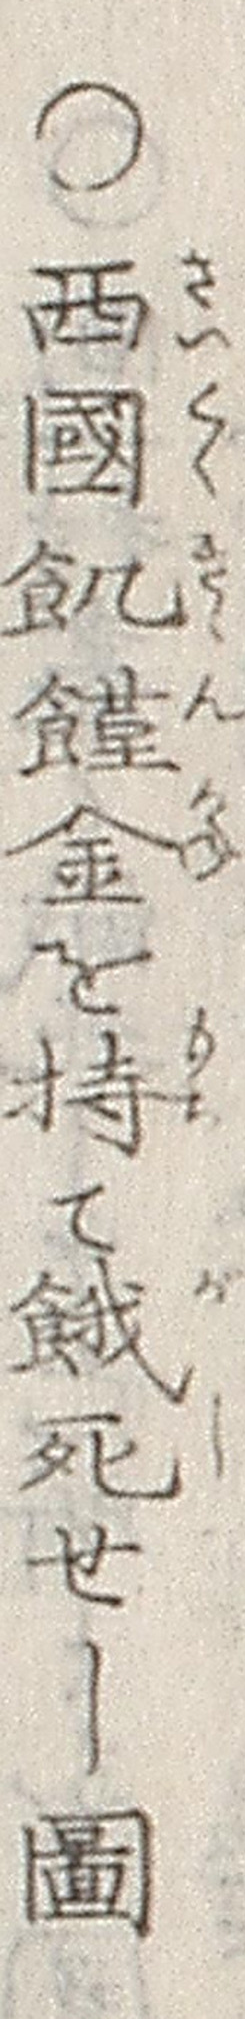〇西国飢饉金を持て餓死せし図
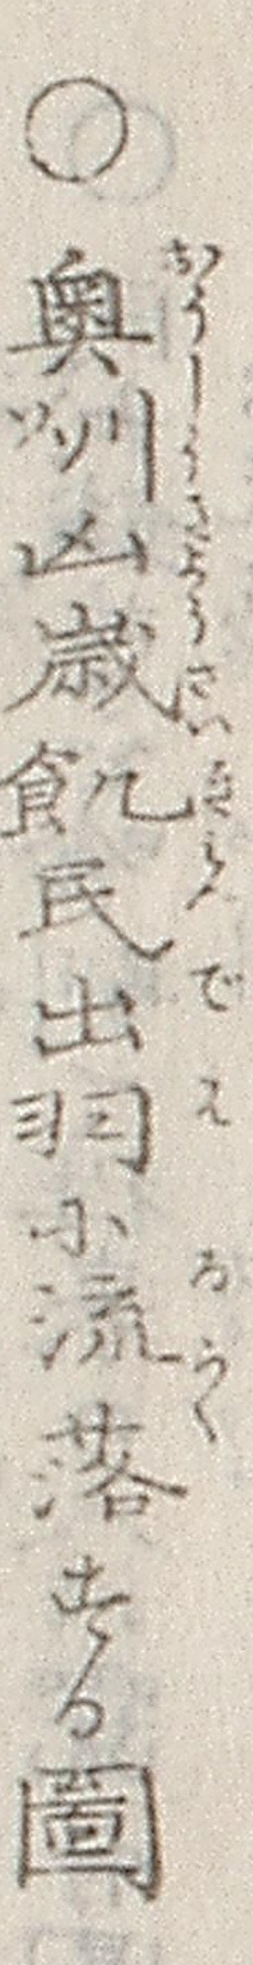〇奥州凶歳飢民出羽に流落する図
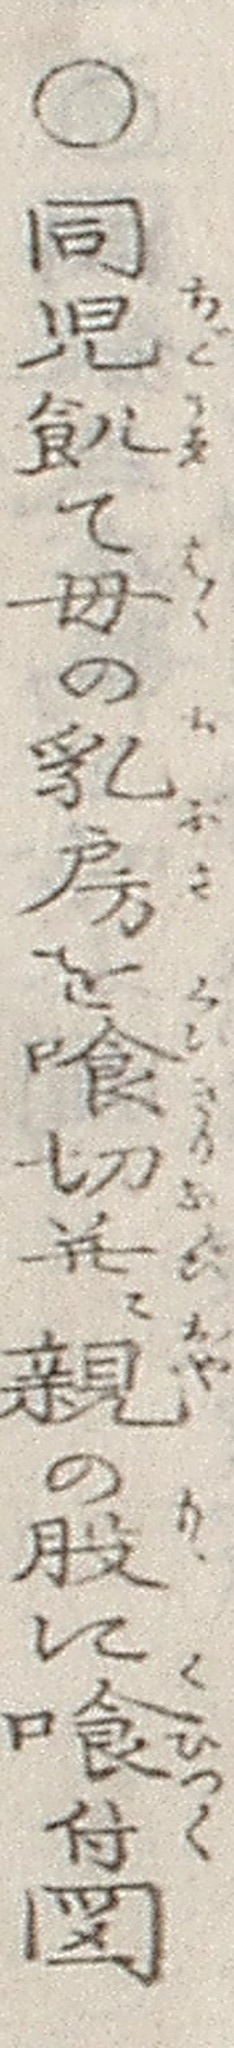〇同児飢て母の乳房を喰切并ニ親の股に喰付図

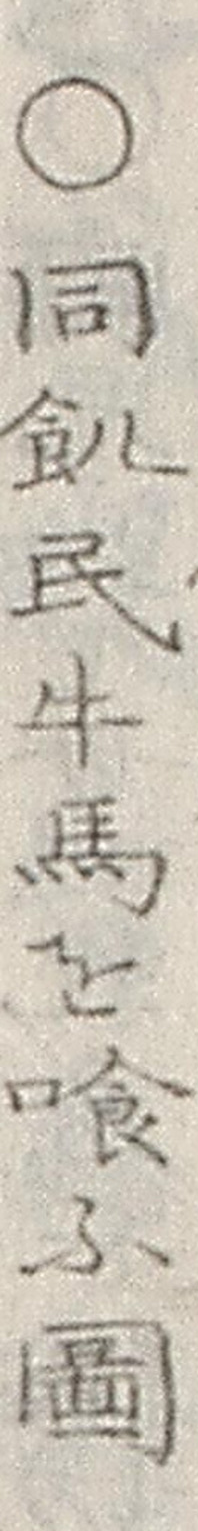〇同飢民牛馬を喰ふ図
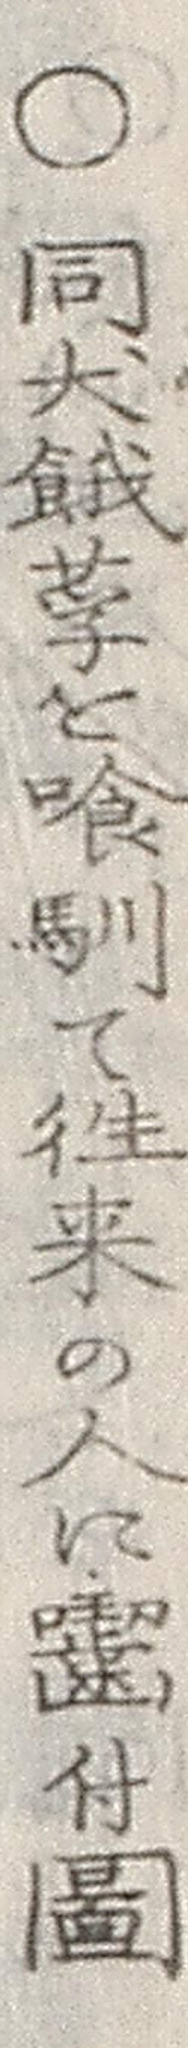〇同犬餓莩を喰馴て往来の人に噛付図
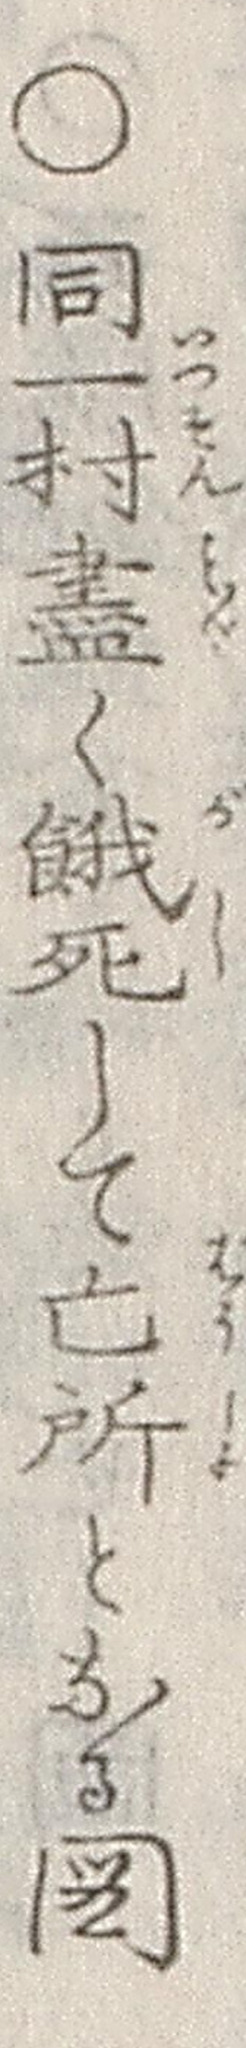〇同一村尽く餓死して亡所となる図
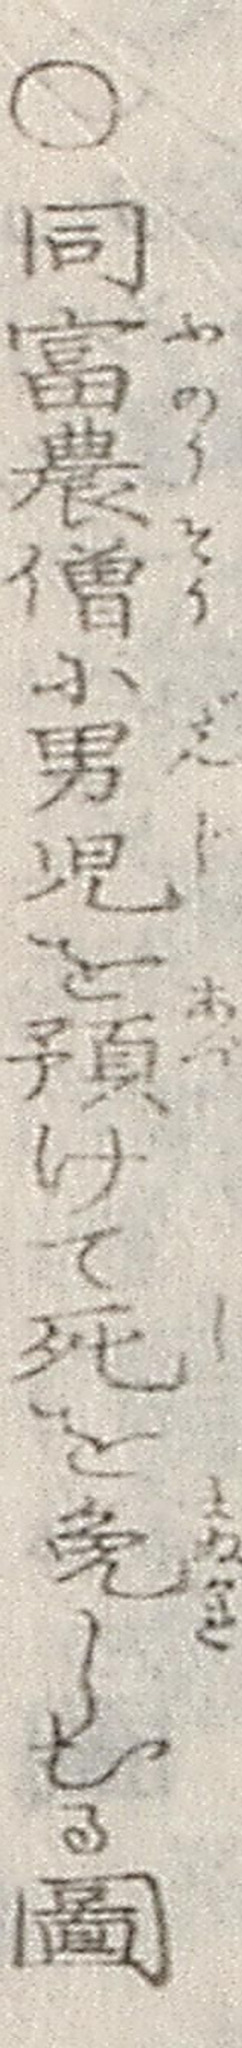〇同富農僧に男児を預けて死を免しむる図
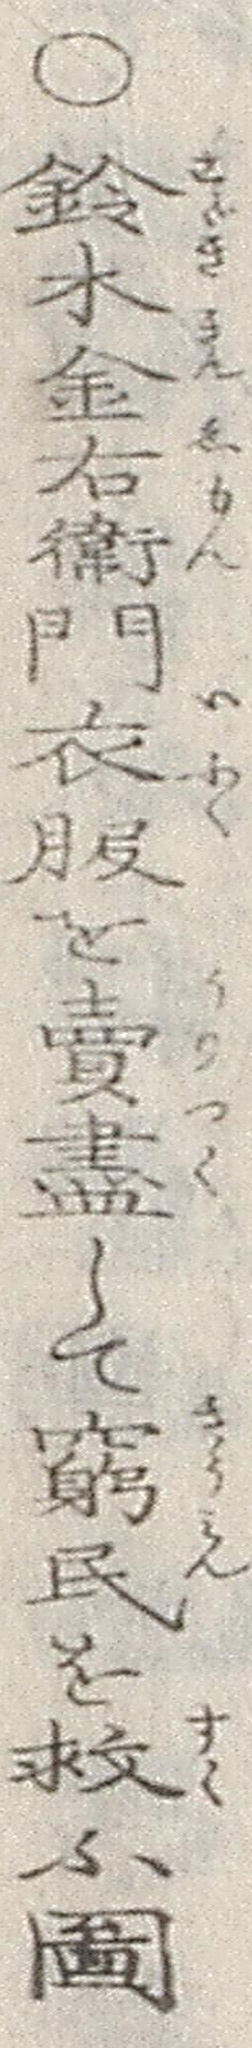〇鈴木金右衛門衣服を売尽して窮民を救ふ図
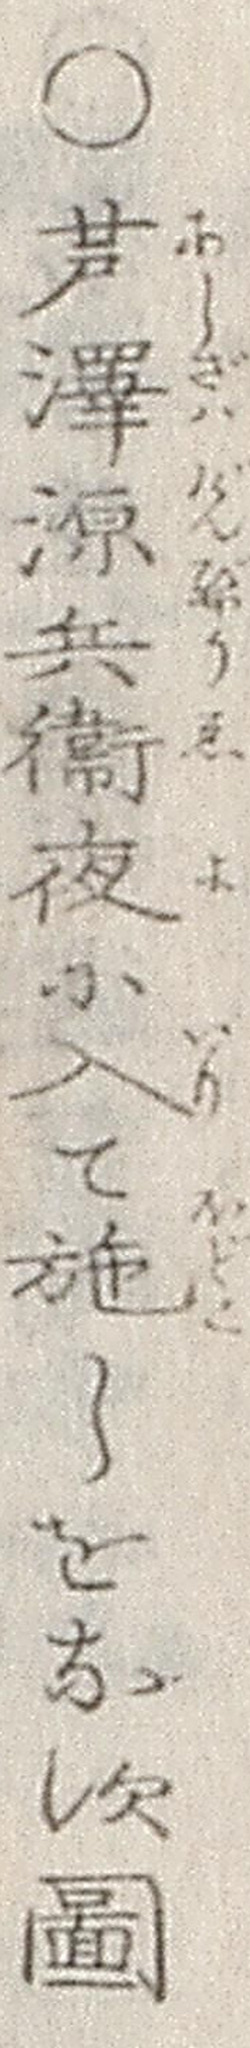〇芦澤源兵衛夜に入て施しをなす図
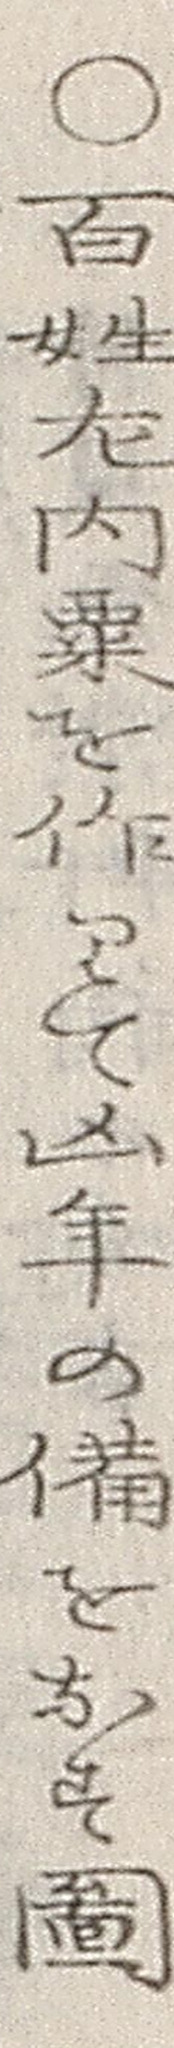〇百姓左内粟を作りて凶年の備をなす図
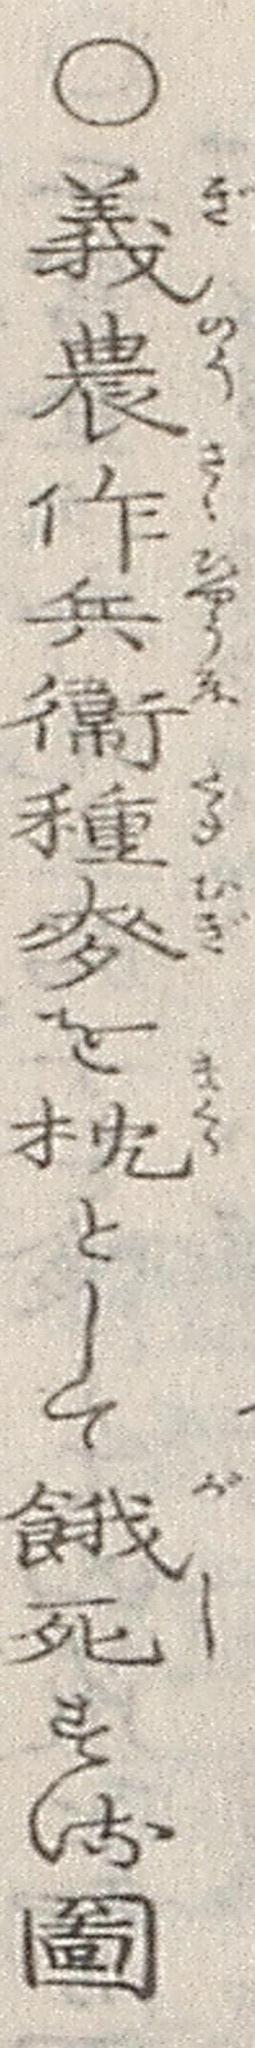〇義農作兵衛種麦を枕として餓死する図
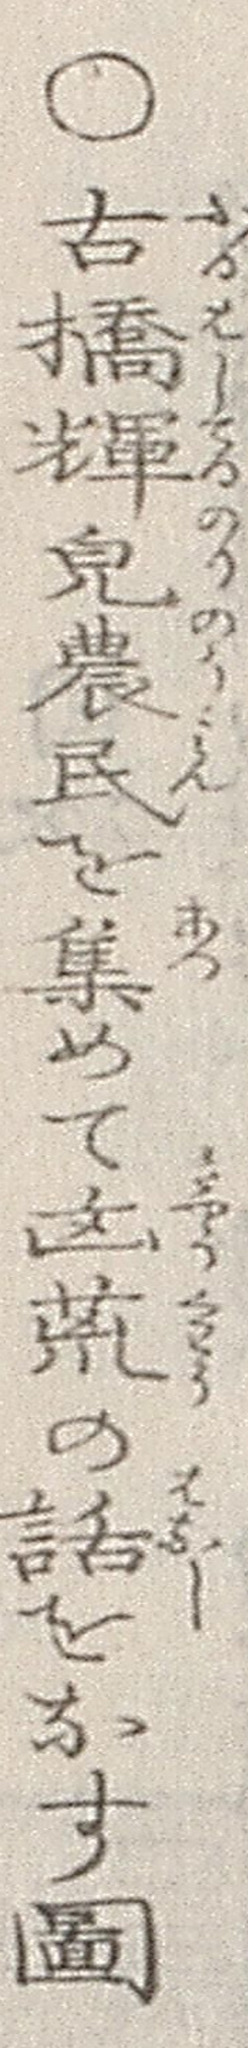〇古橋輝皃農民を集めて凶荒の話をなす図
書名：凶荒図録　完
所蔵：東京大学地震研究所図書室 Earthquake Research Institute Library, The University of Tokyo, JAPAN
